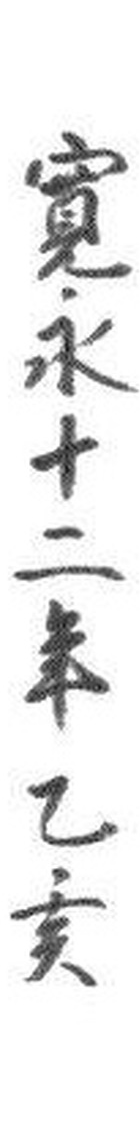寛永十二年乙亥
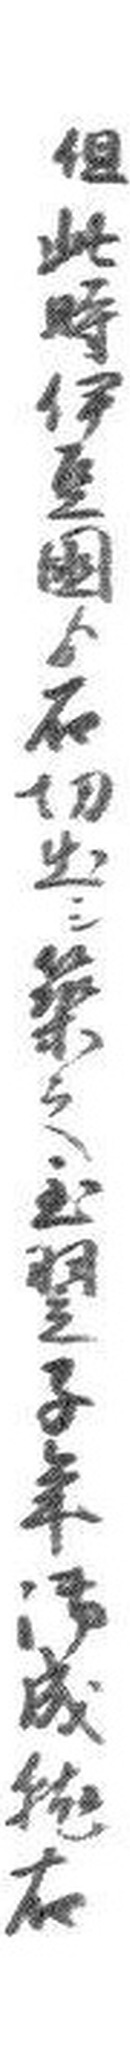但此時伊豆国ゟ石切出シ築之至翌子年御成就右
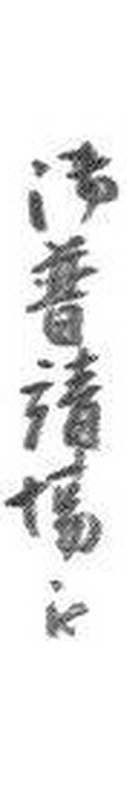御普請場江
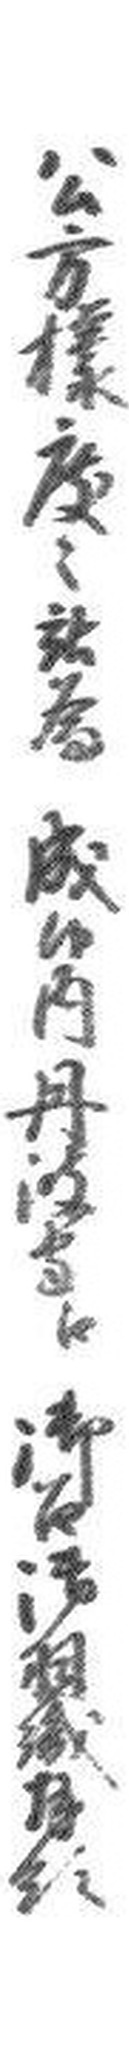公方様度々被為成候内丹波守江御召御羽織拝領
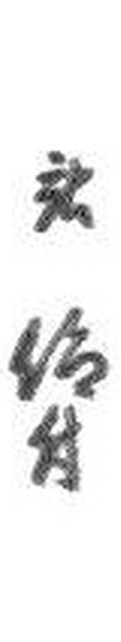被仰付
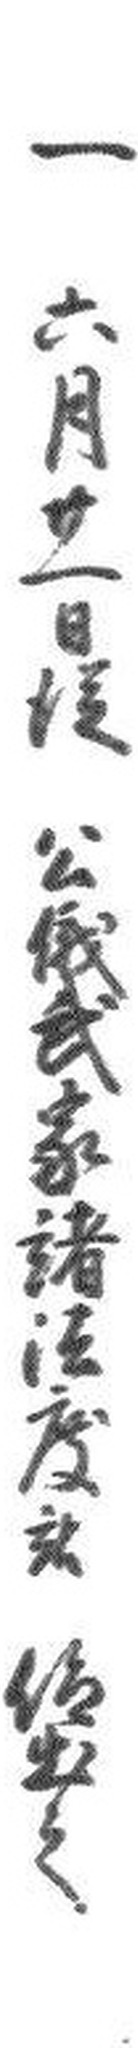一六月廿一日従公儀武家諸法度被仰出之

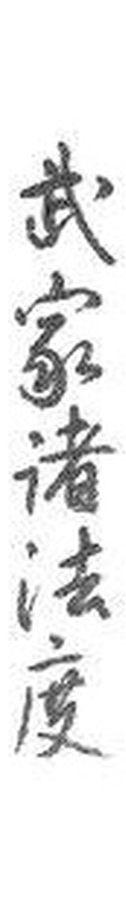武家諸法度
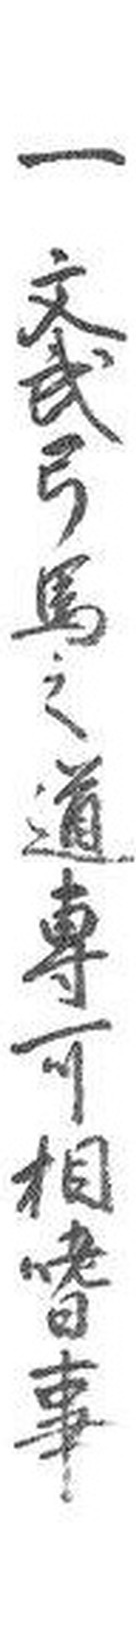一文武弓馬之道専可相嗜事
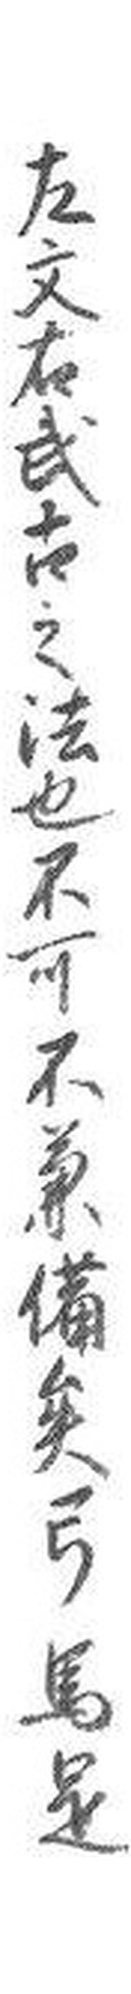左文右武古之法也不可不兼備矣弓馬是
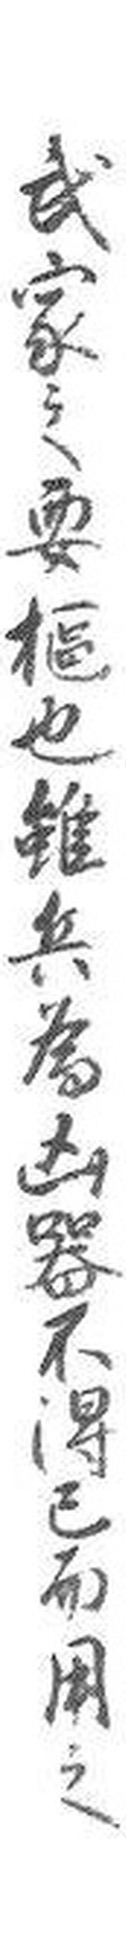武家之要樞也雖兵為凶器不得已而用之
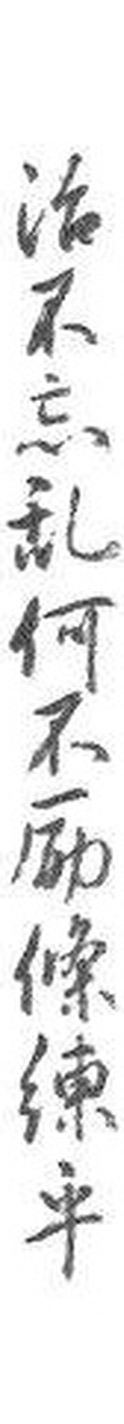治不忘乱何不励条練乎
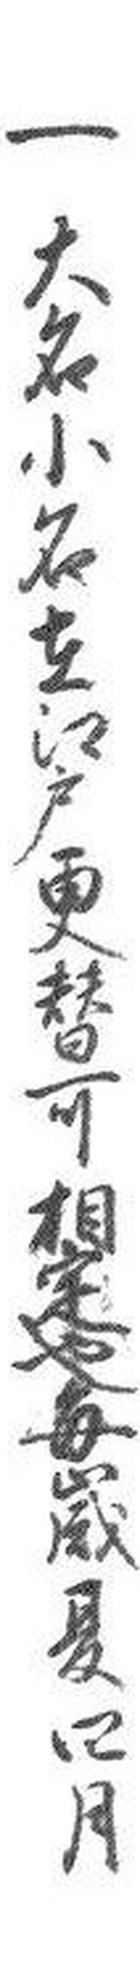一大名小名在江戸更替可相定也毎歳夏四月
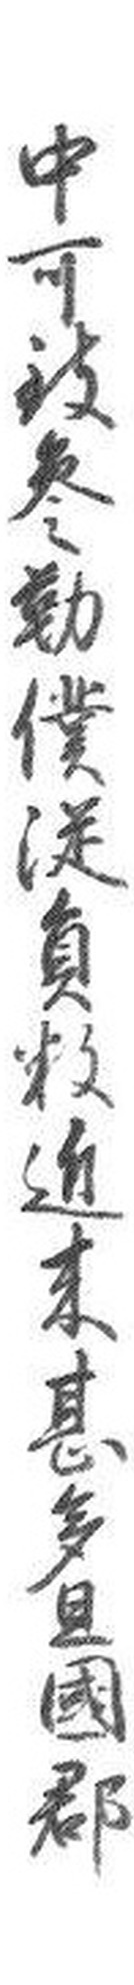中可致参勤僕従員数近来甚多且国郡
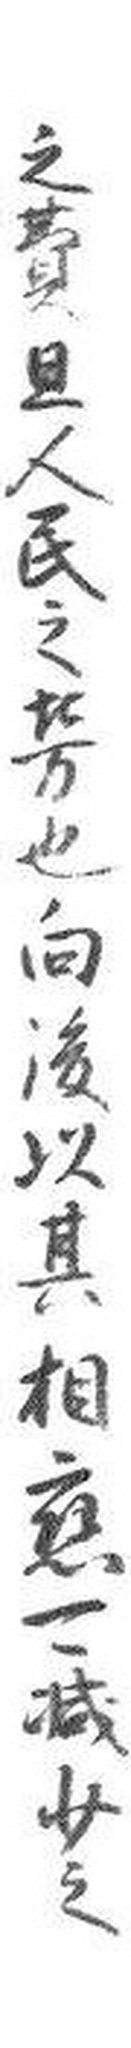之費且人民之労也向後以其相応可減少之
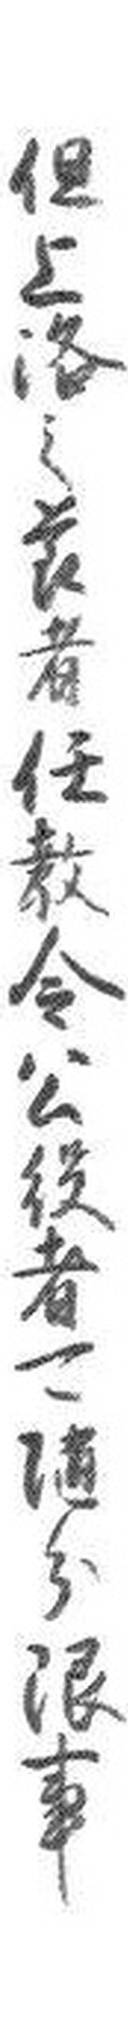但上洛之節者任教令公役者可随分限事
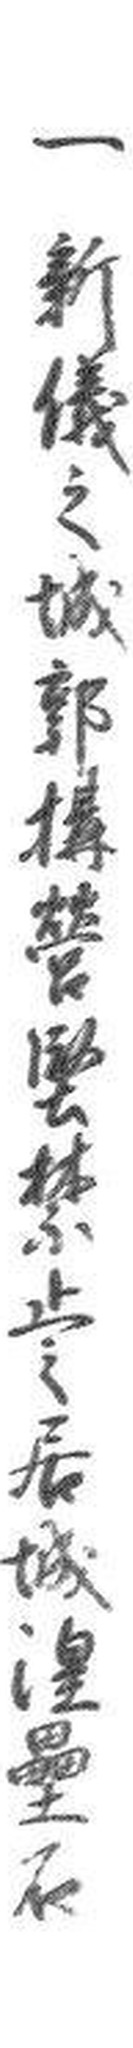一新儀之城郭構営堅禁止之居城湟塁石
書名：家譜 四 忠昌公 従寛永七年到正保四年
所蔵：福井県文書館 Fukui Prefectural Archives
